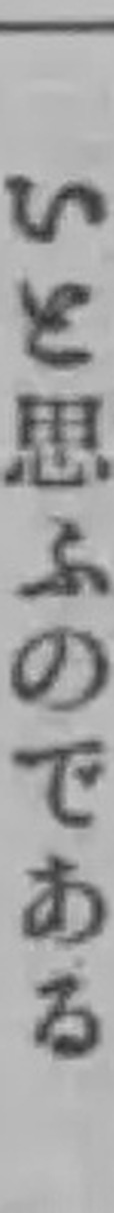いと思ふのである
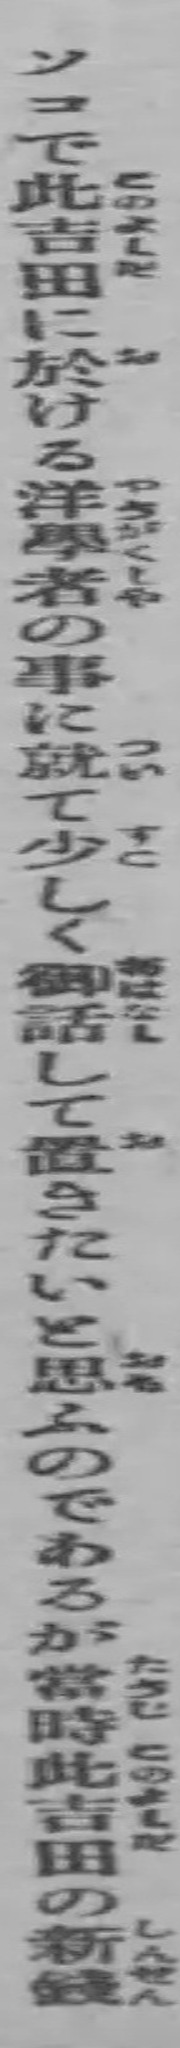彦坂菊作ソコで此吉田に於ける洋学者の事に就て少しく御話して置きたいと思ふのであるが当時此吉田の新銭
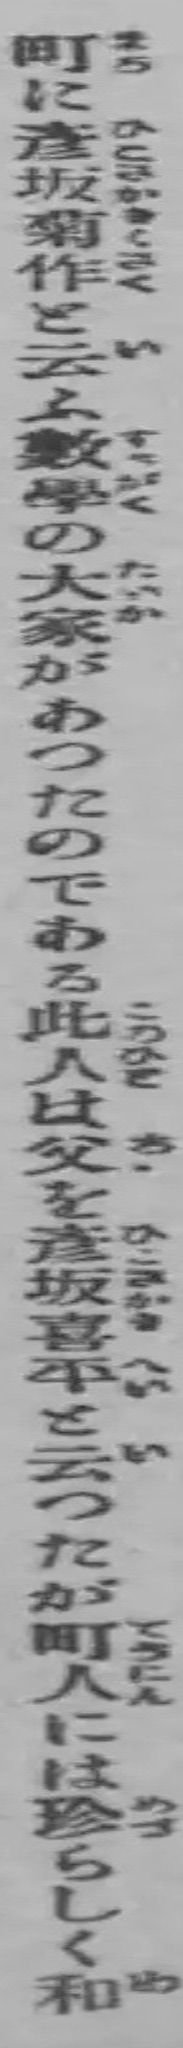町に彦坂菊作と云ふ数学の大家があつたのである此人は父を彦坂喜平と云つたが町人には珍らしく和
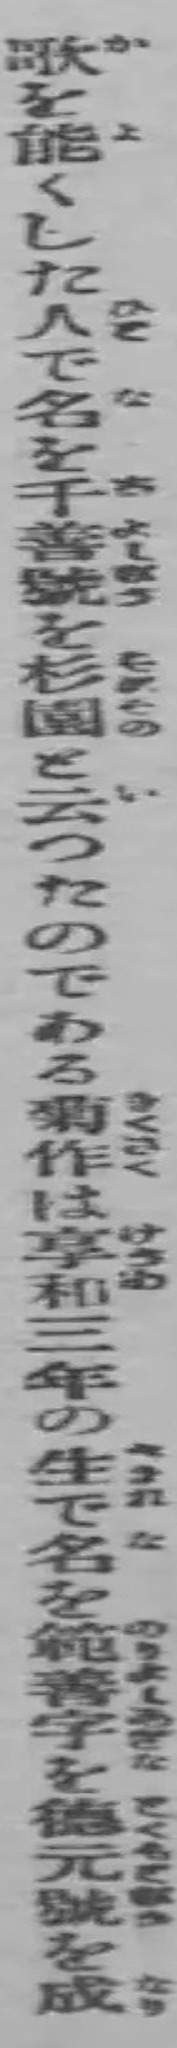歌を能くした人で名を千善号を杉園と云つたのである菊作は享和三年の生で名を範善字を徳元号を成
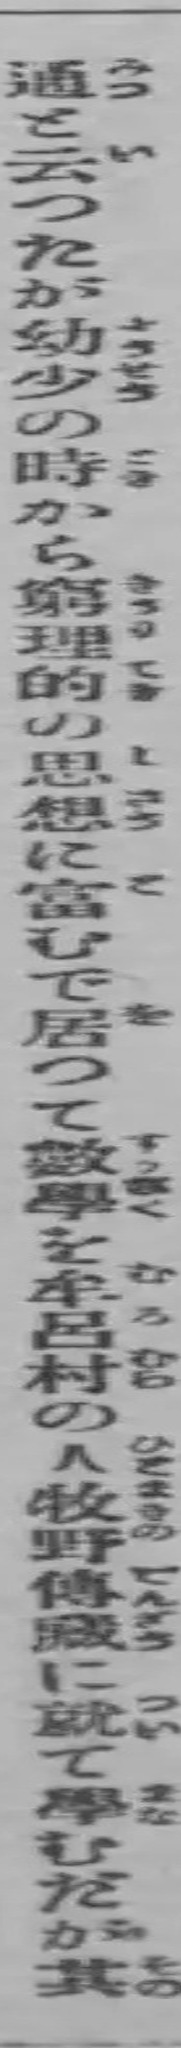通と云つたが幼少の時から窮理的の思想に富むで居つて数学を牟呂村の人牧野傳蔵に就て学むだが其
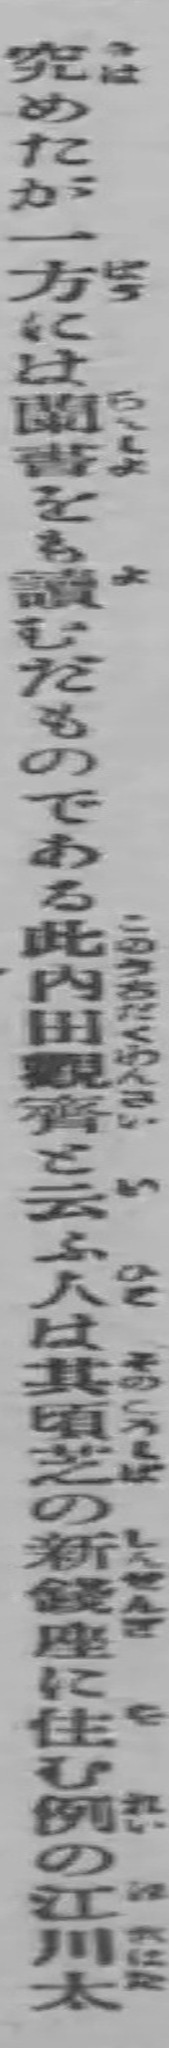究めたが一方には蘭書をも読むだものである此内田観斉と云ふ人は其頃芝の新銭座に住む例の江川太
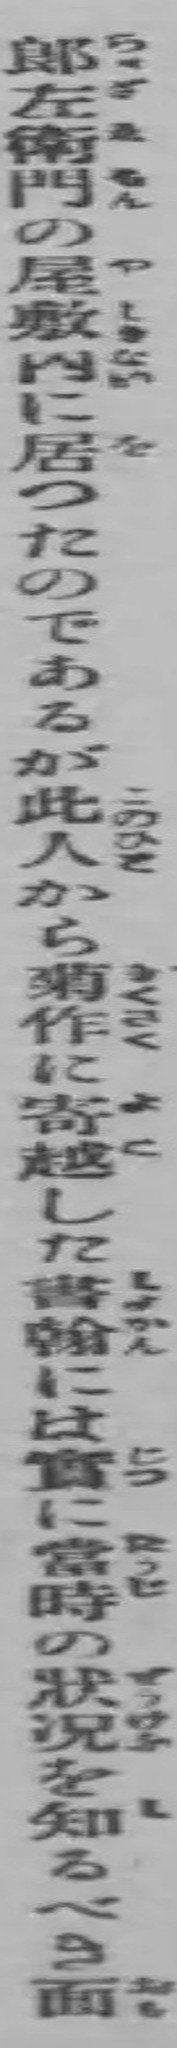郎左衛門の屋敷内に居つたのであるが此人から菊作に寄越した書翰には実に当時の状況を知るべき面
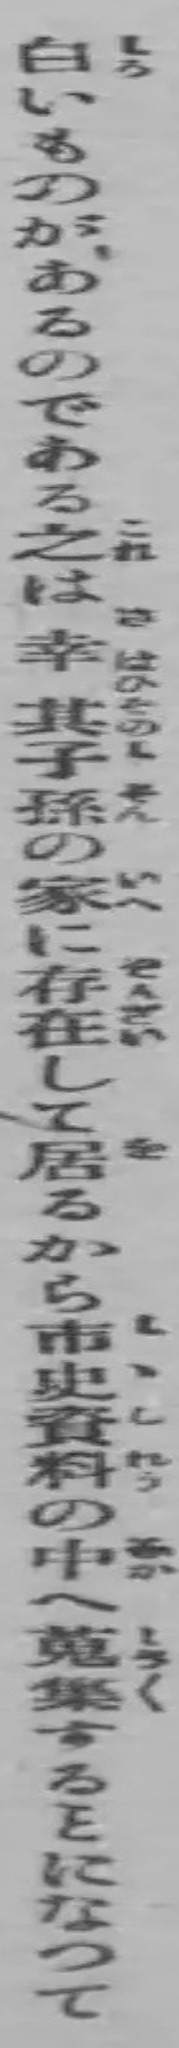白いものがあるのである之は幸其子孫の家に存在して居るから市史資料の中へ蒐集することになつて
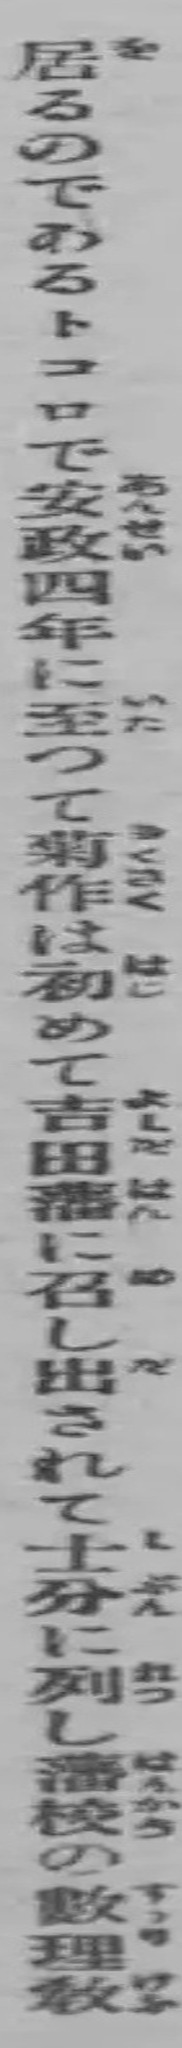居るのであるトコロで安政四年に至つて菊作は初めて吉田藩に召し出されて士分に列し藩校の数理教
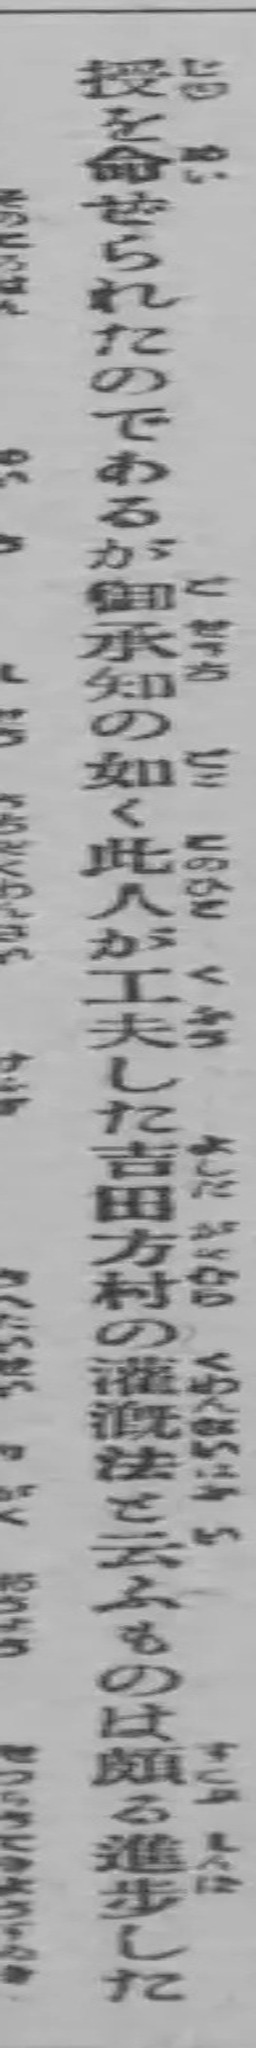授を命ぜられたのであるが御承知の如く此人が工夫した吉田方村の灌漑法と云ふものは頗る進歩した
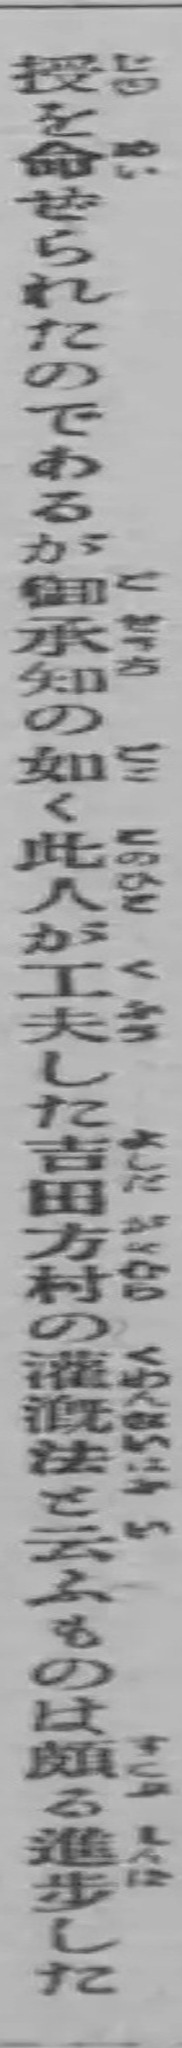授を命ぜられたのであるが御承知の如く此人が工夫した吉田方村の灌漑法と云ふものは頗る進歩した
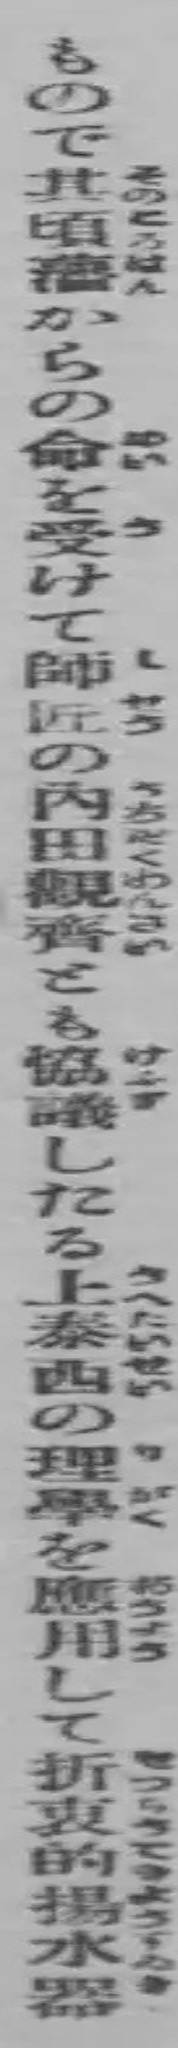もので其頃藩からの命を受けて師匠の内田観斉とも協議したる上泰西の理学を応用して折衷的揚水器
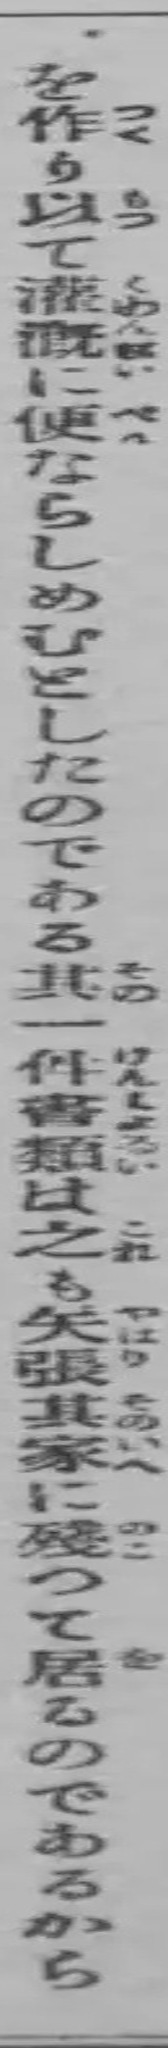を作り以て灌漑に便ならしめむとしたのである其一件書類は之も矢張其家に残つて居るのであるから
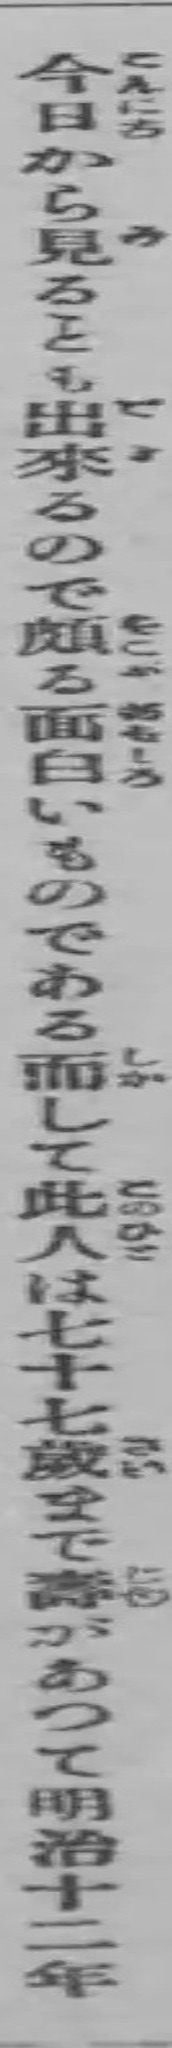今日から見ることも出来るので頗る面白いものである而して此人は七十七歳まで寿があつて明治十二年
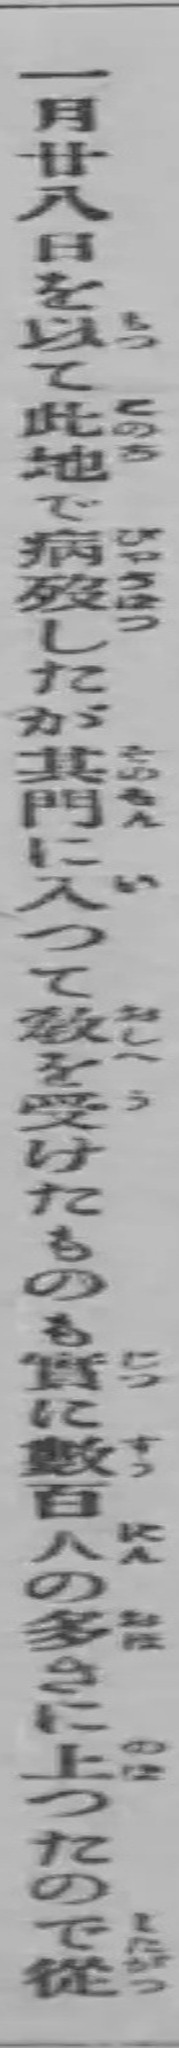一月廿八日を以て此地で病歿したが其門に入つて教を受けたものは実に数百人の多さに上つたので従
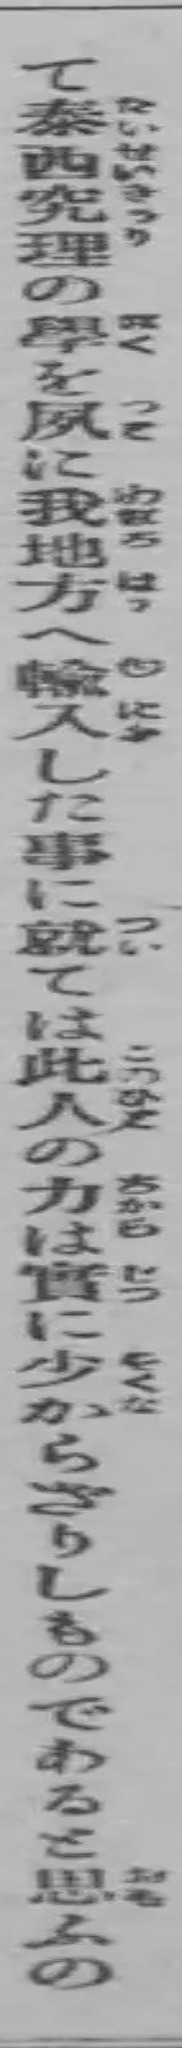て泰西究理の学を夙に我地方へ輸入した事に就ては此人の力は実に少からざりしものであると思ふの
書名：豊橋市史談
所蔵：国立国会図書館 National Diet Library, JAPAN
